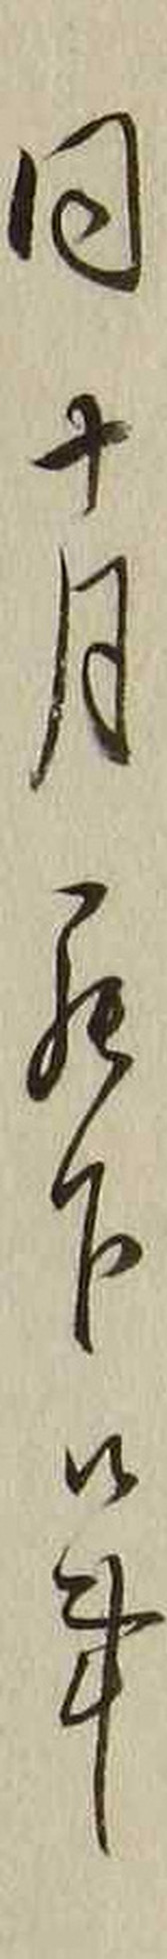同十月罷下候事
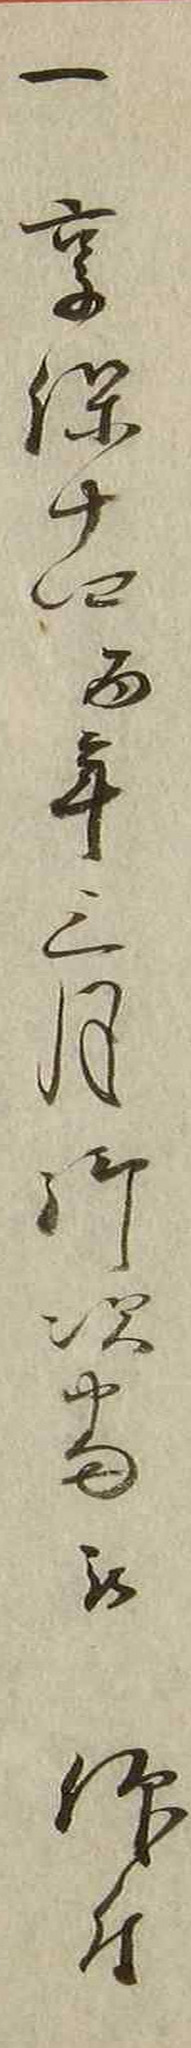一享保十四酉年三月御次番被仰付
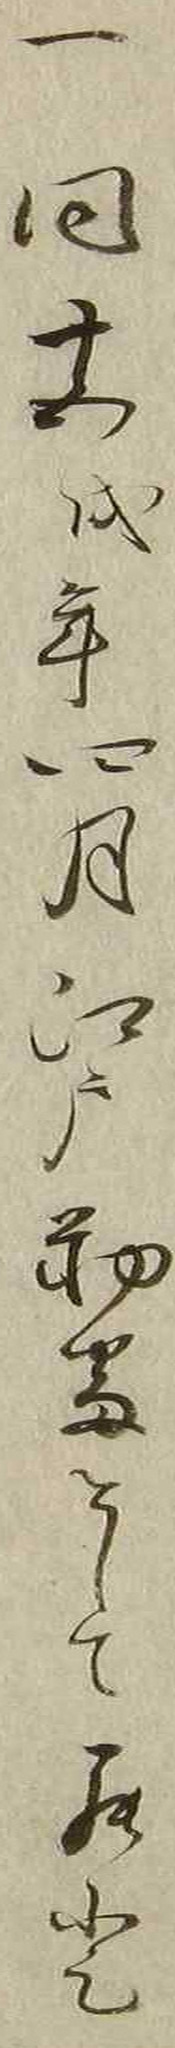一同十五戌年四月江戸勤番として罷登
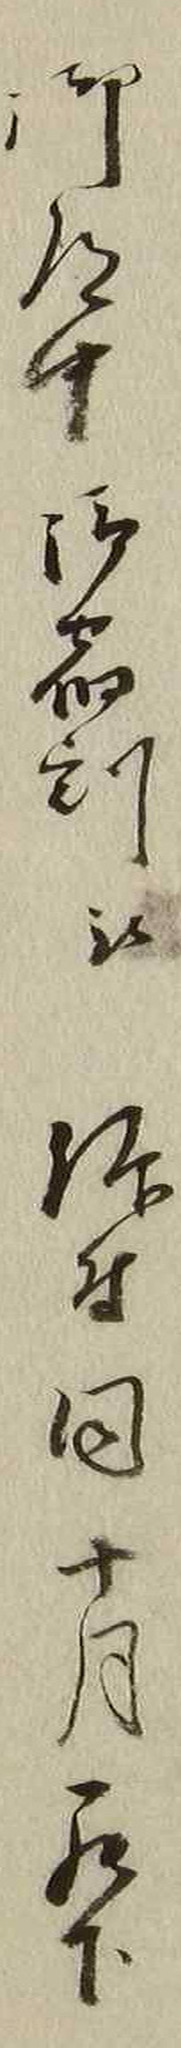御道中御宿割被仰付同十月罷下
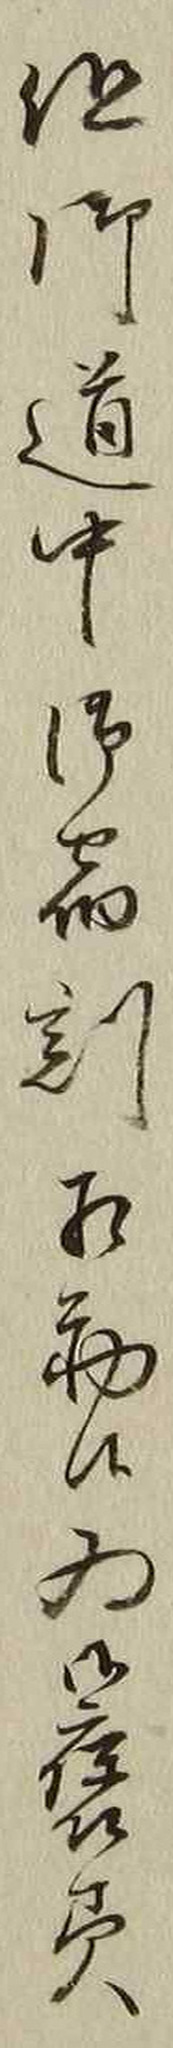但御道中御宿割相勤候為御褒美
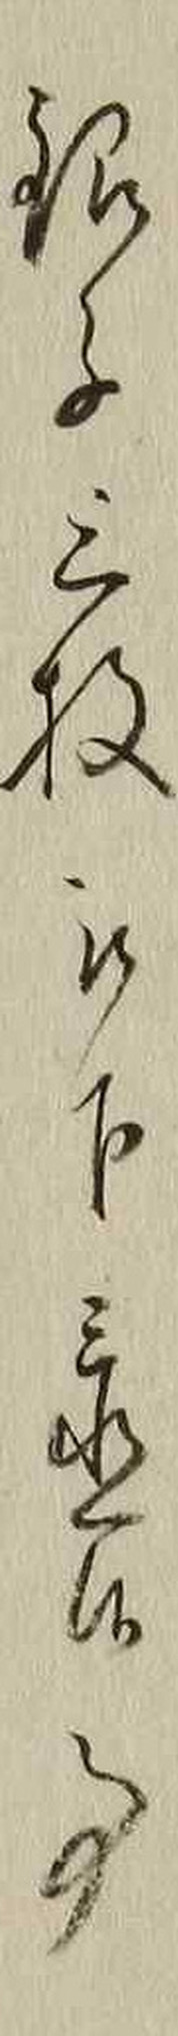銀子三枚被下置候事
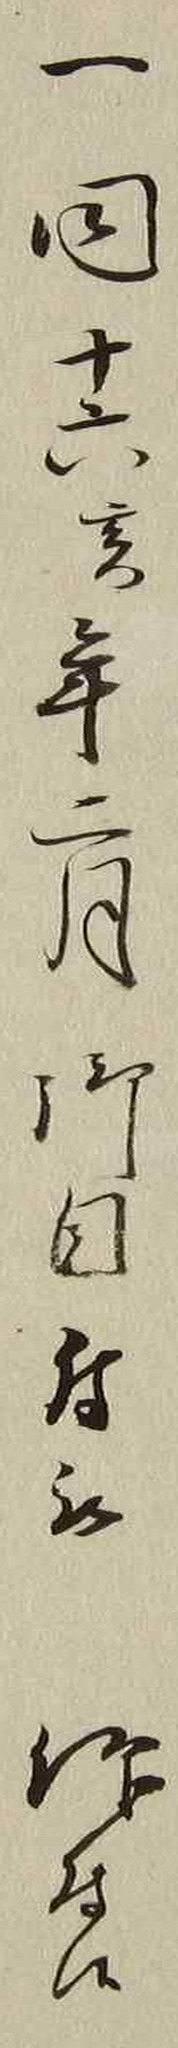一同十六亥年二月御目付被仰付候
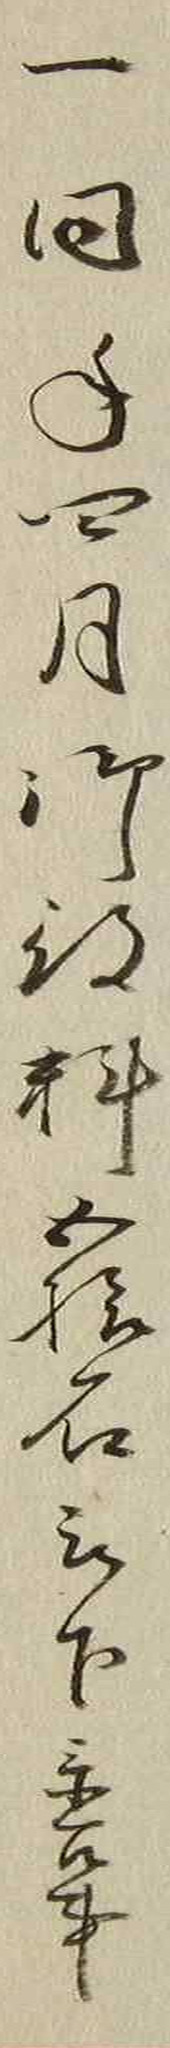一同年四月御役料五拾石被下置候事
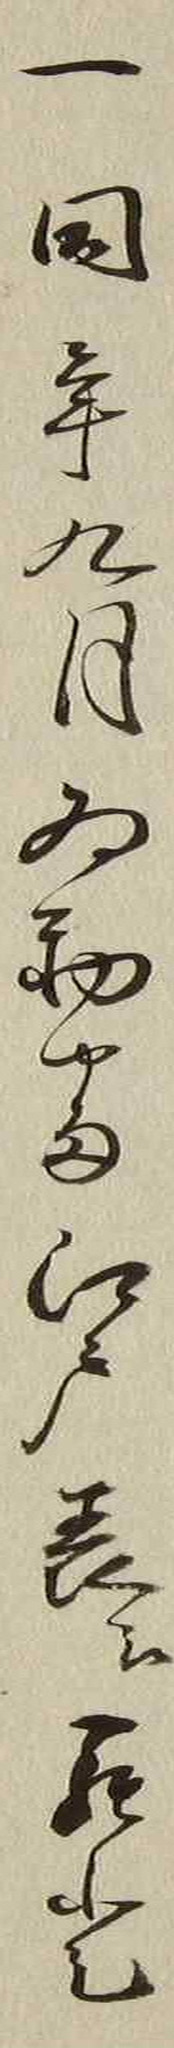一同年九月為勤番江戸表江罷登
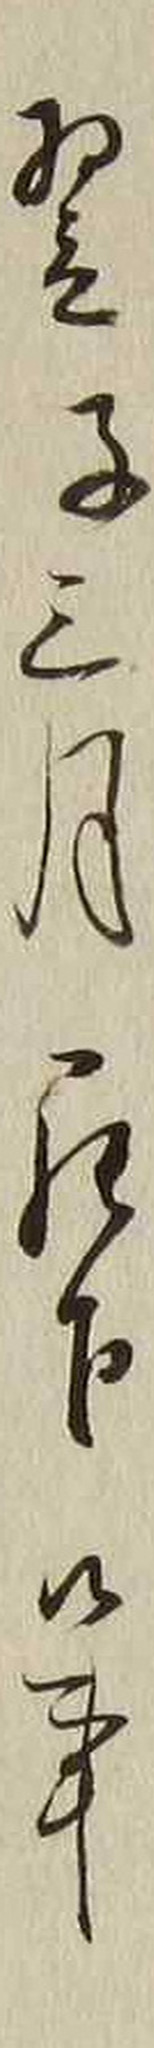翌子三月罷下候事
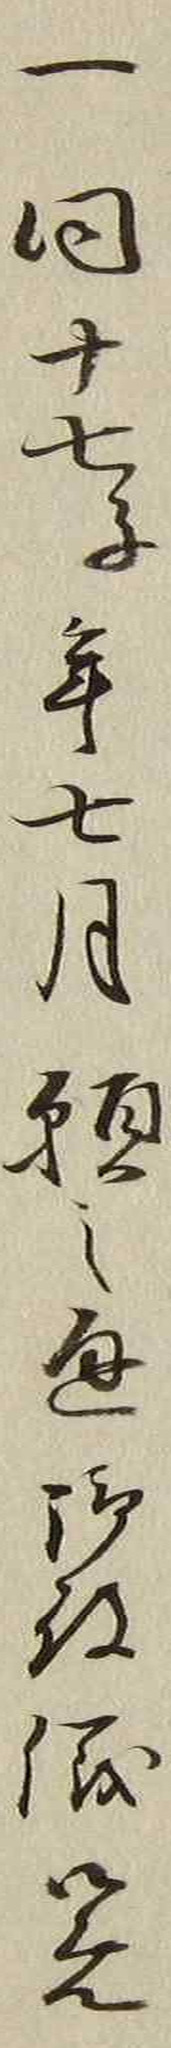一同十七子年七月願之通御役儀御免
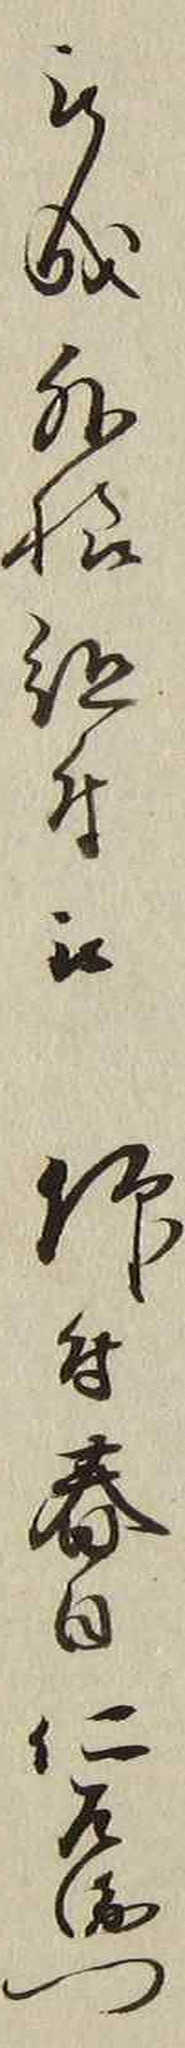被成外様組付被仰付春日仁左衛門
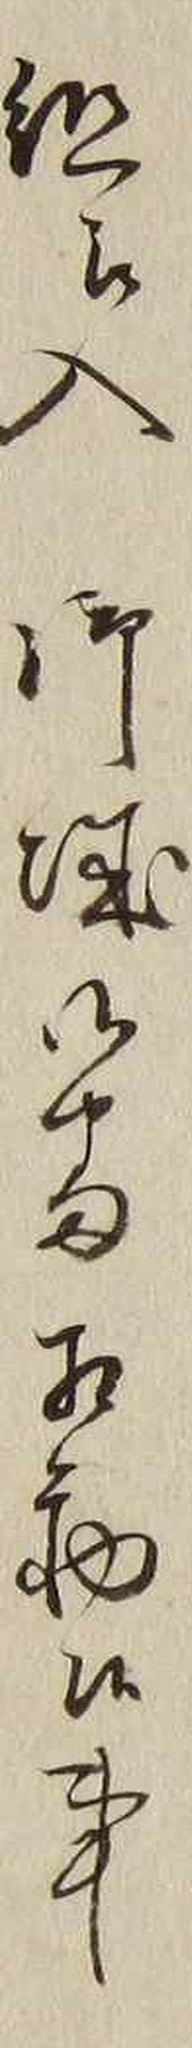組江入御城御番相勤候事
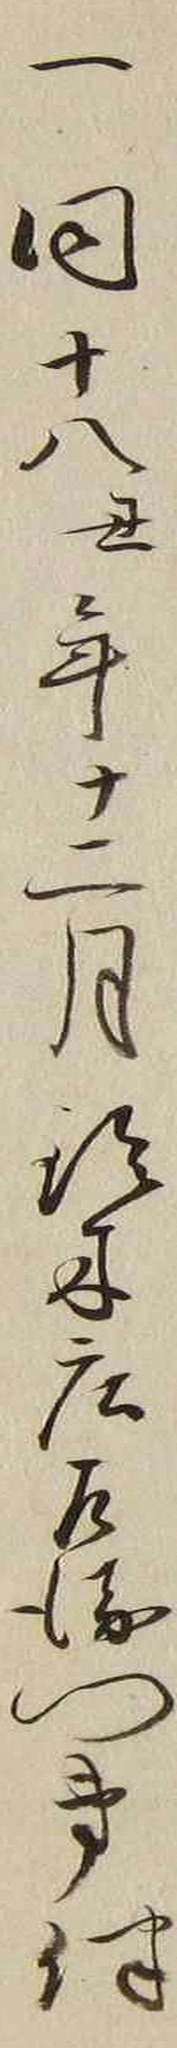一同十八丑年十二月鈴木庄左衛門弟伴
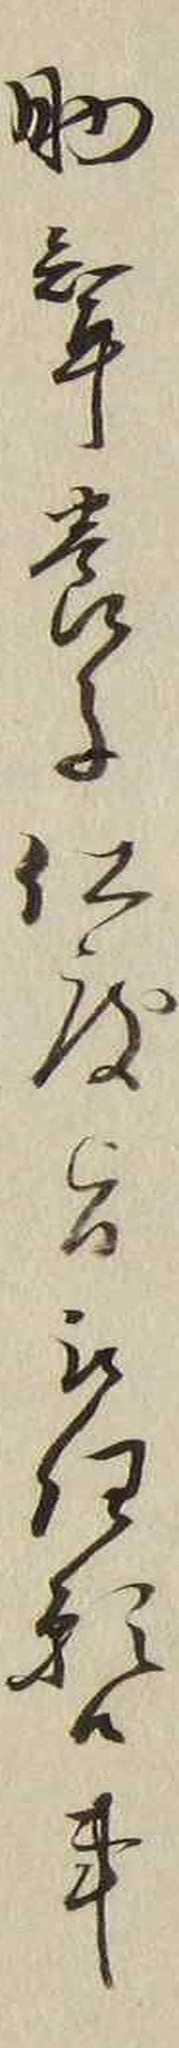助聟養子仕度旨被任願候事

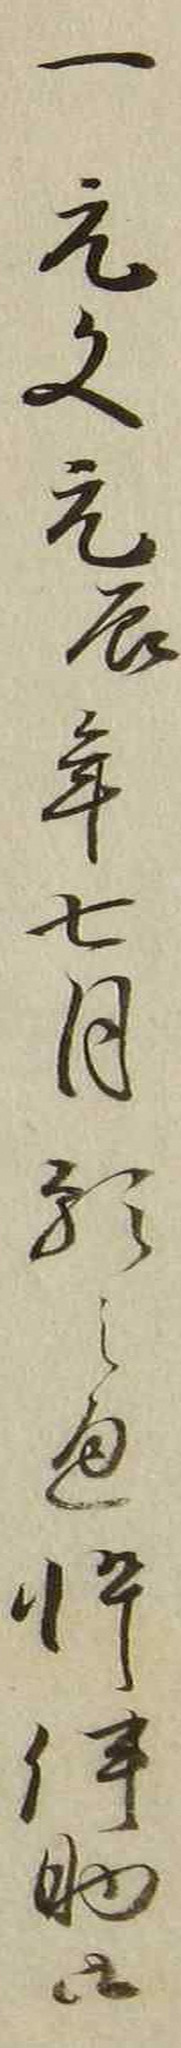一元文元辰年七月願之通忰伴助御
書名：諸士系譜　巻之25　い之部25
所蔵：会津若松市立会津図書館
